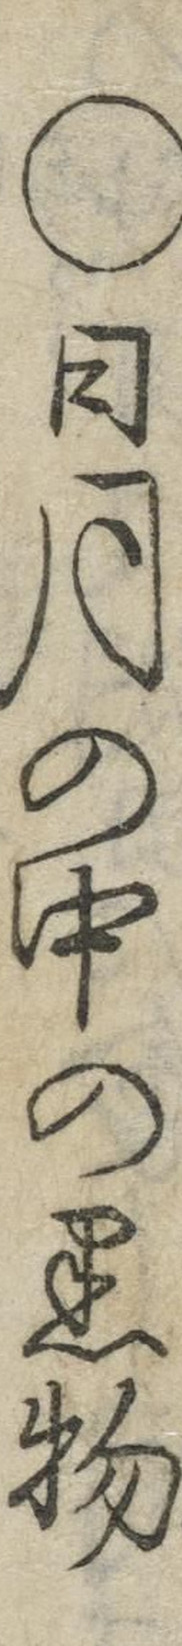○日月の中の黒物
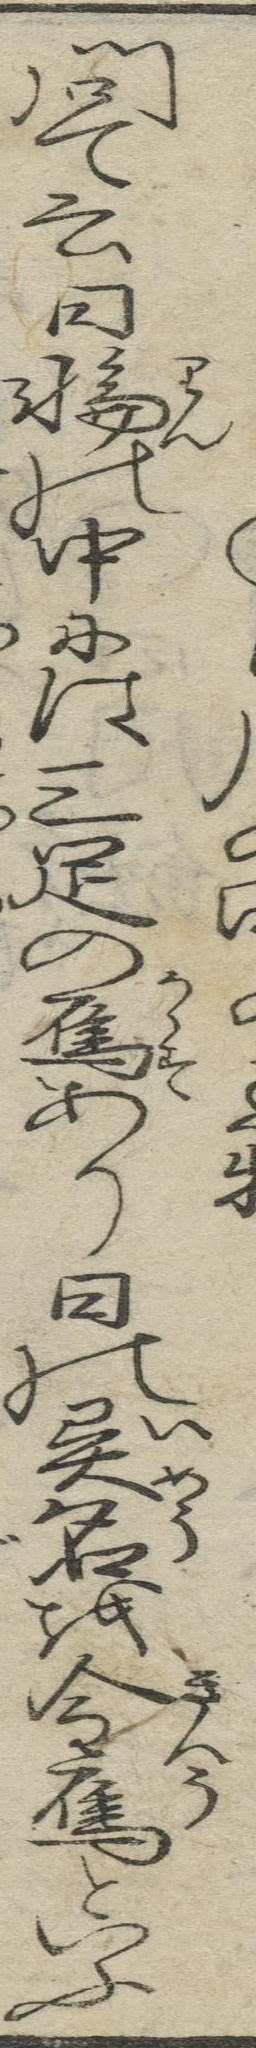問て云日輪の中には三足の烏あり日の異名を金烏といふ
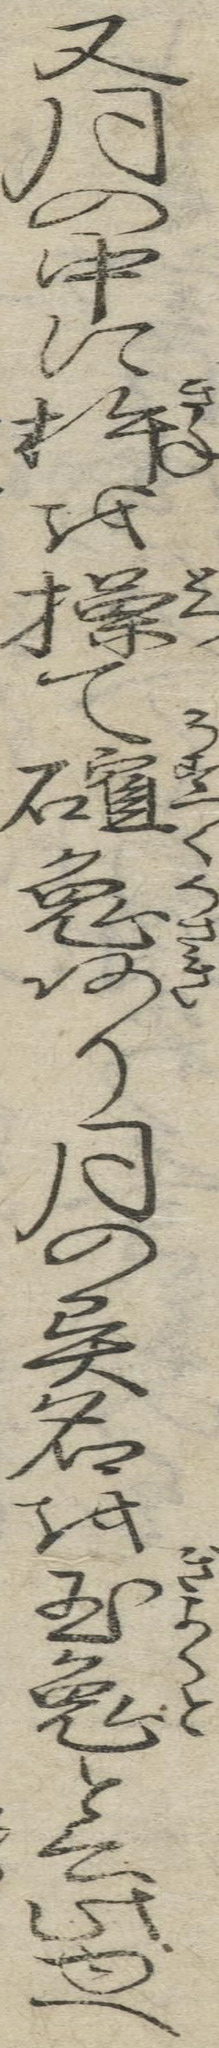又月の中に杵を操て碓兎あり月の異名を玉兎と云此ゆへ
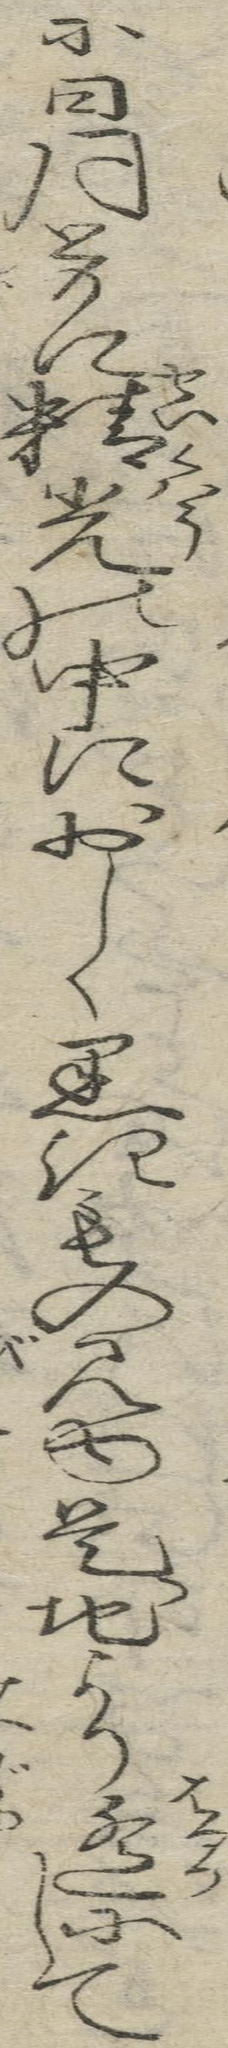に日月ともに精光の中に少しく黒きもの見ゆ是地より遥にして
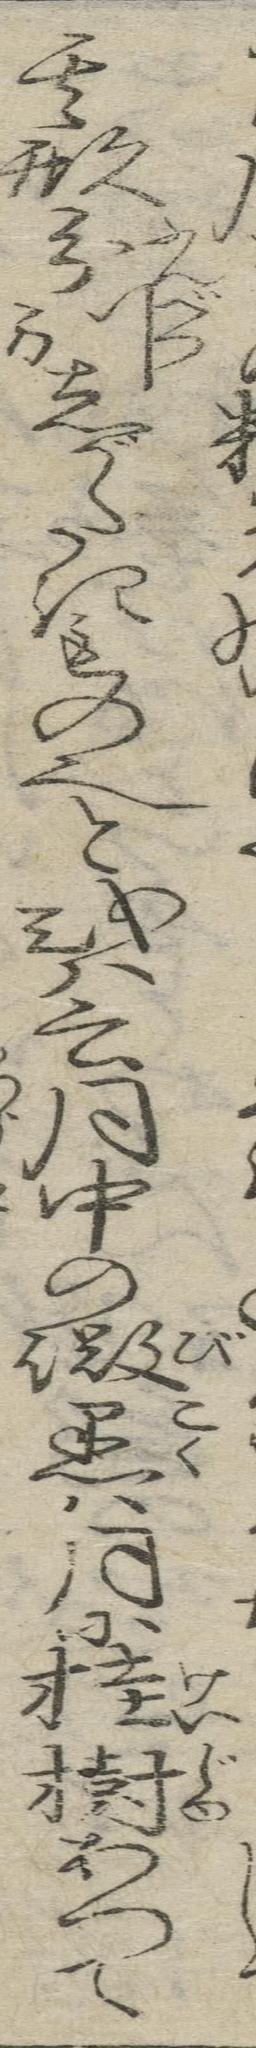其形分別しがたきもの也と或は云月中の微黒は月に桂樹あつて
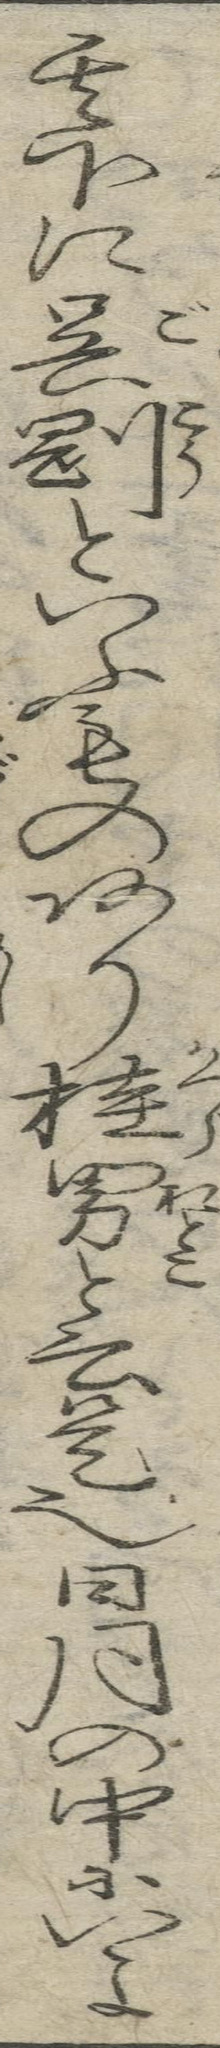其下に呉剛といふものあり桂男と云是也日月の中にいよ
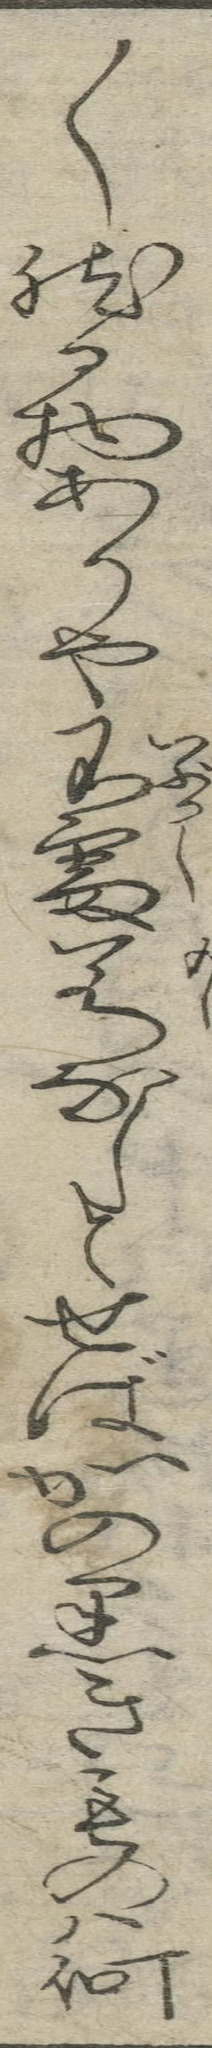〳〵然る物ありや不審若なしとせばかの黒きものは何
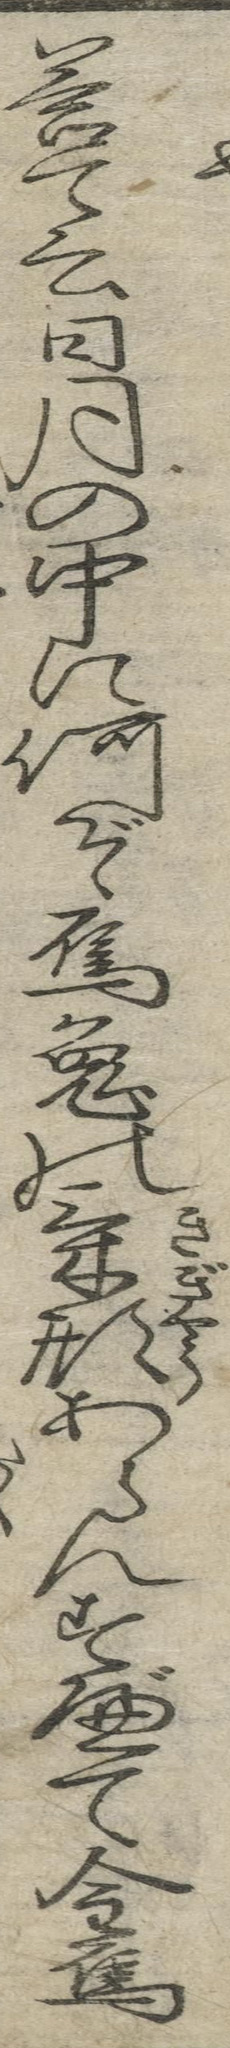答て云日月の中に何ぞ烏兎の気形あらんすべて金烏
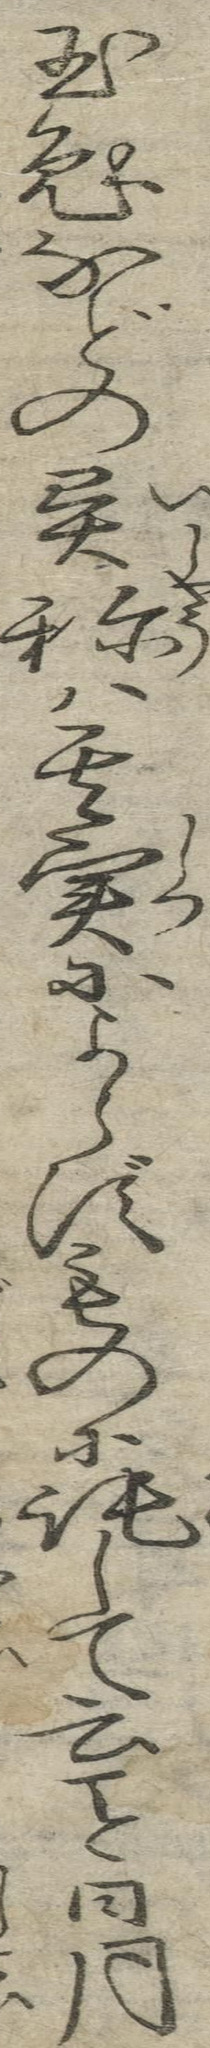玉兎などの異称は其実によらずものに託して云こと日月
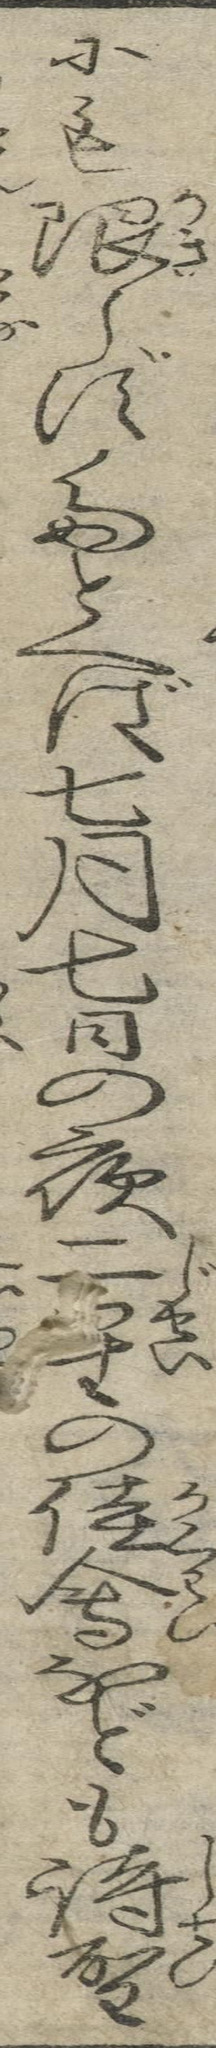にも限らうたとへば七月七日の夜二星の佳会なども詩聖
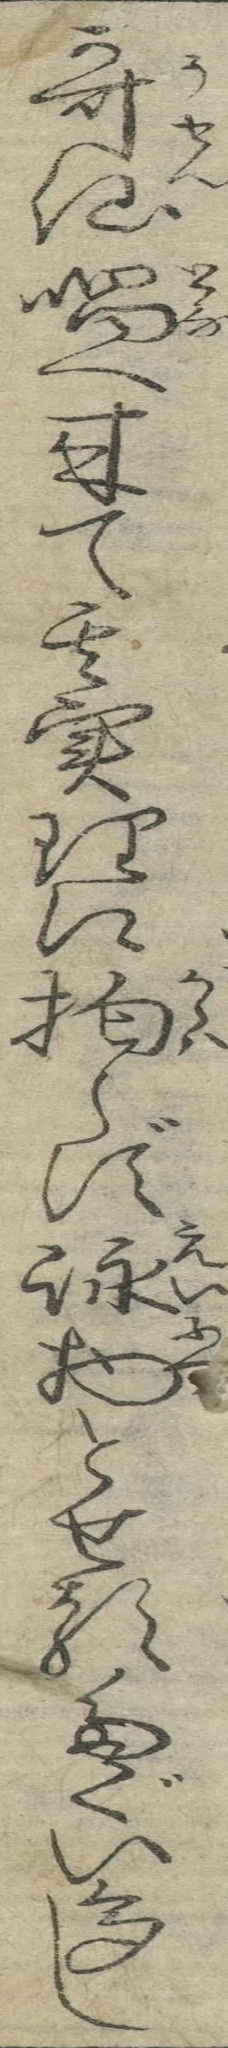歌仙唱へ来て其実理に拘らず詠物とせるたぐい多し

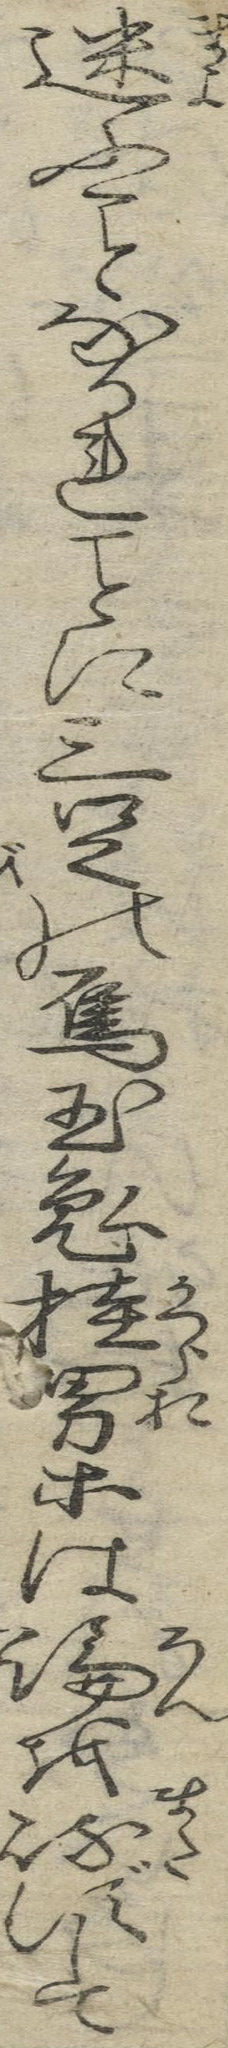迷ふことなかれことに三足の烏玉兎桂男等は論を待ずして
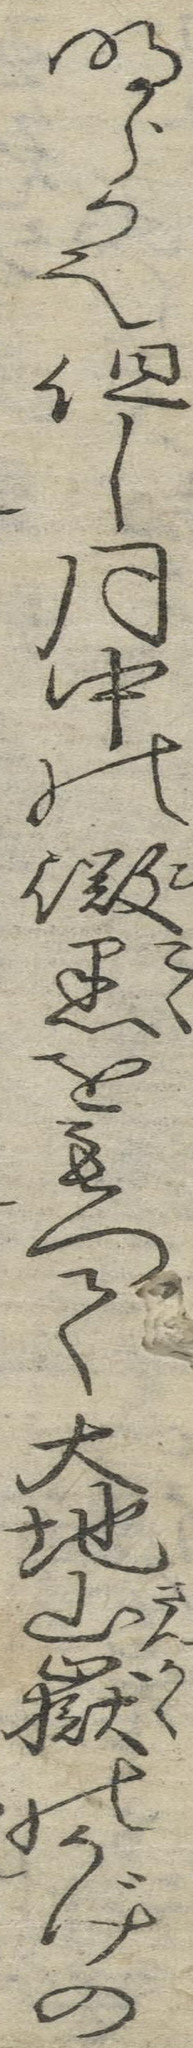明らか也但し月中の微黒をもつて大地山岳のかげの
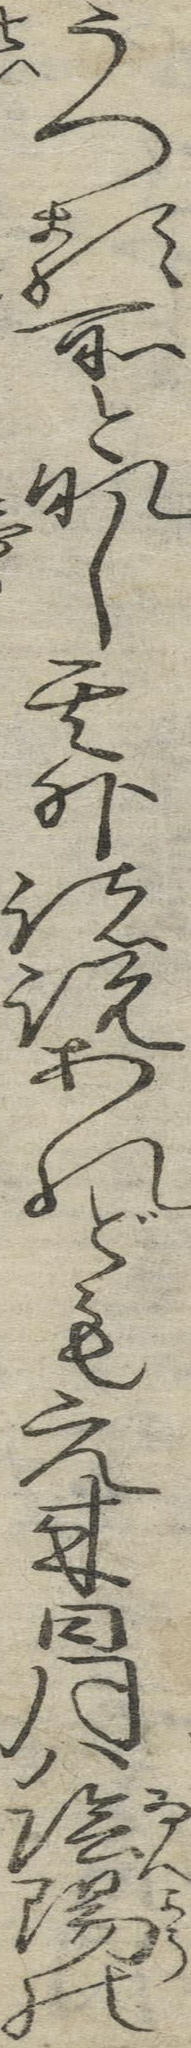うつる所となし其外諸説あれども元来日月は陰陽の
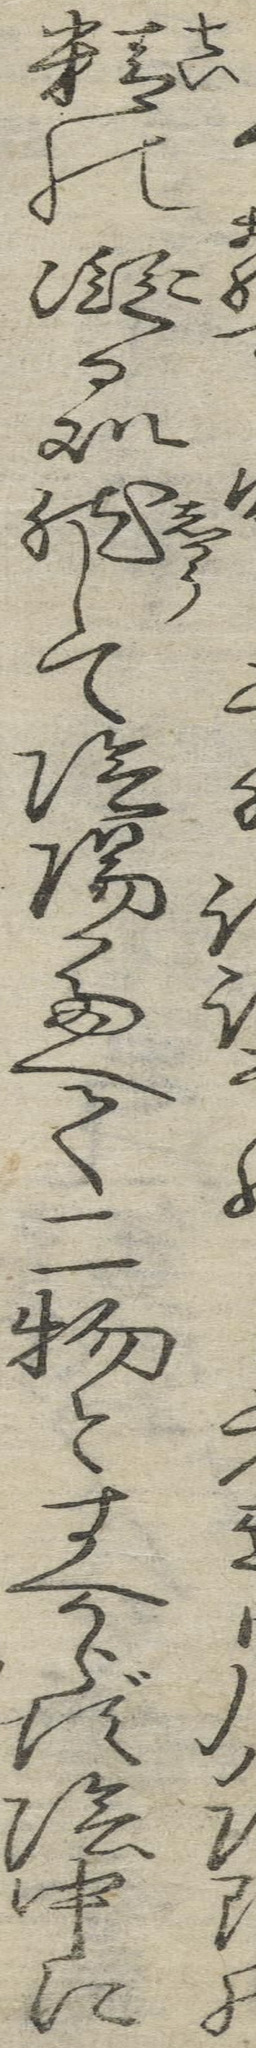精の凝る処然して陰陽たへて二物とすへからず陰中に
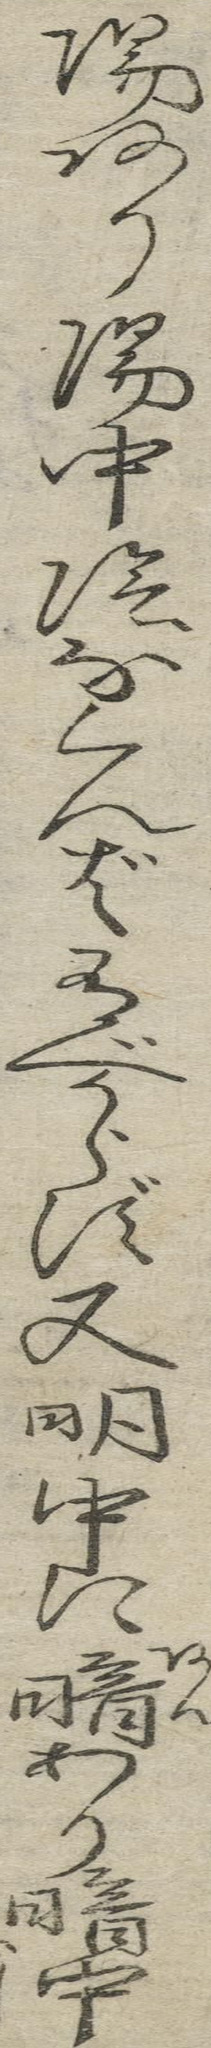陽あり陽中に陰なくんば有べからず又明中に暗あり暗中
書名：訓蒙天地辨　天
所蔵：東京大学地震研究所図書室 Earthquake Research Institute Library, The University of Tokyo, JAPAN
